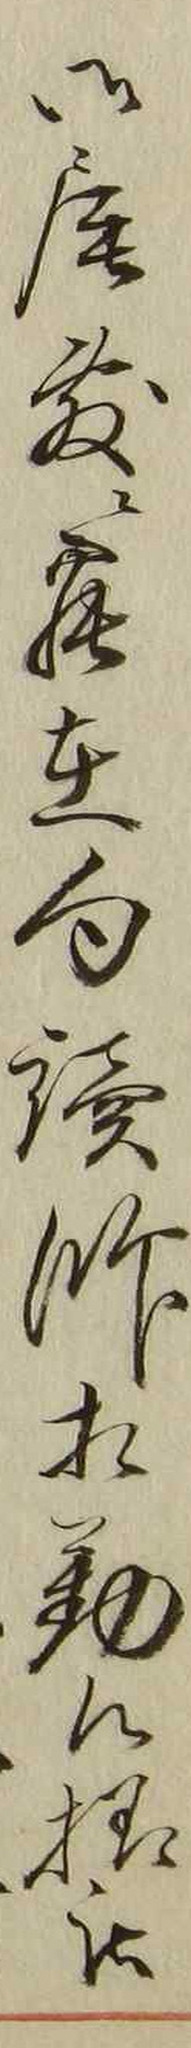御屋敷ニ罷在句読師相勤候様被
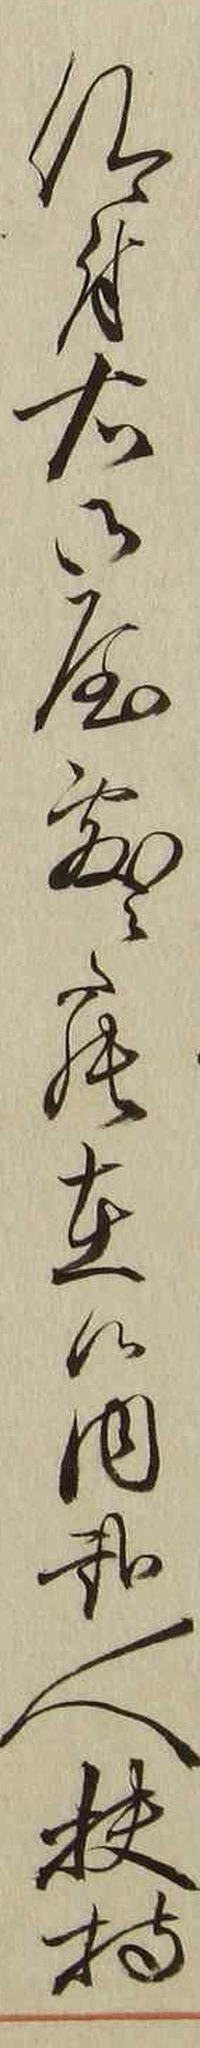仰付右御屋敷ニ罷在候内弐人扶持
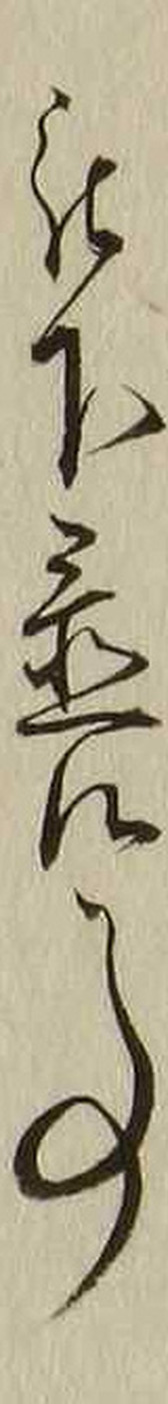被下置候事
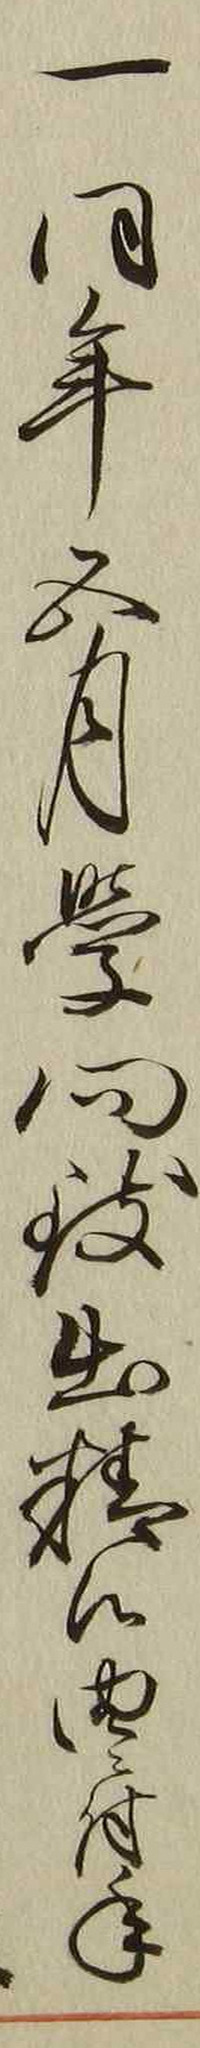一同年五月学問致出精候由ニ付年
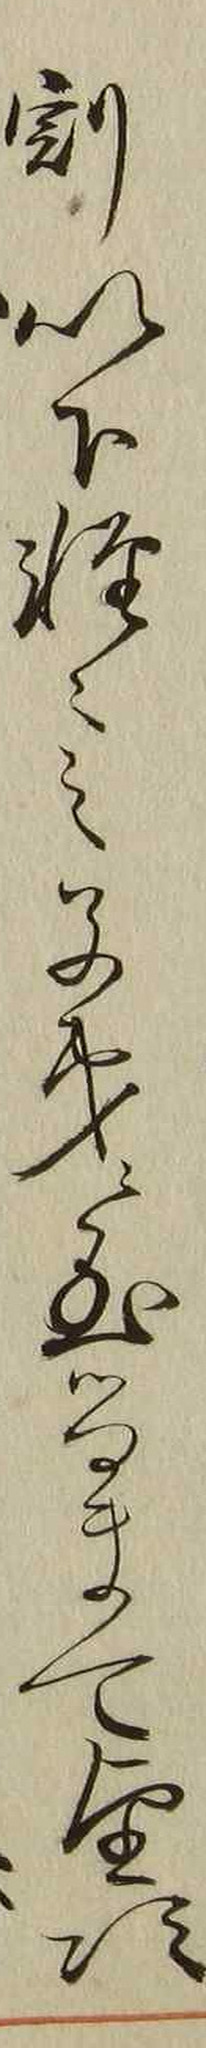割以下種々之子弟ニ至るまて望次
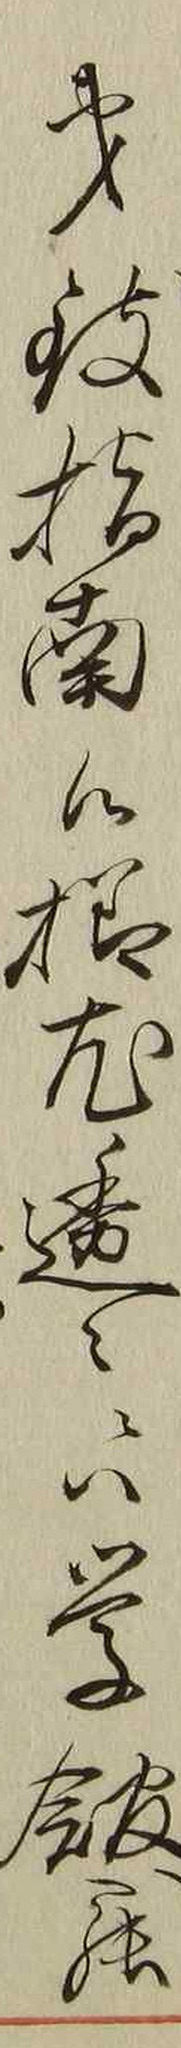第致指南候様尤透々ニハ学館へ罷
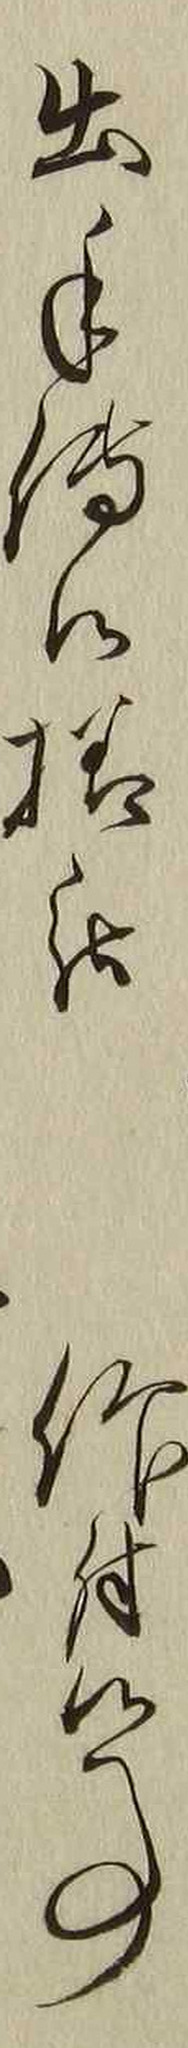出手伝候様被仰付候事
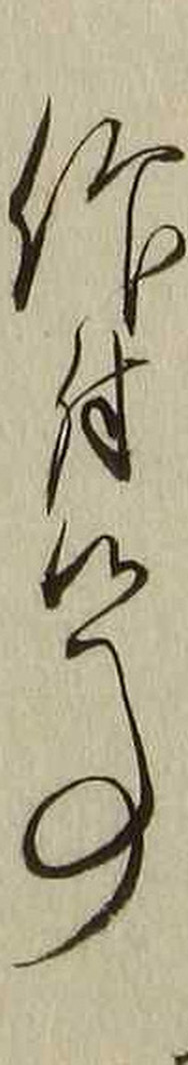仰付候事
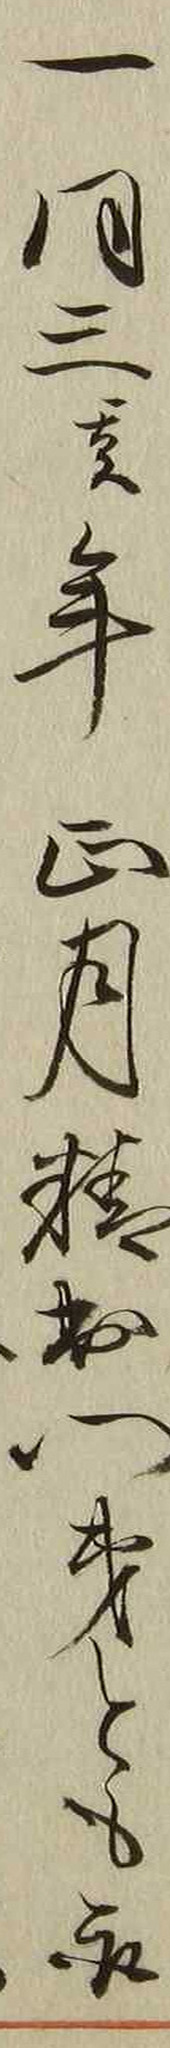一同三亥年正月精出門弟とも御
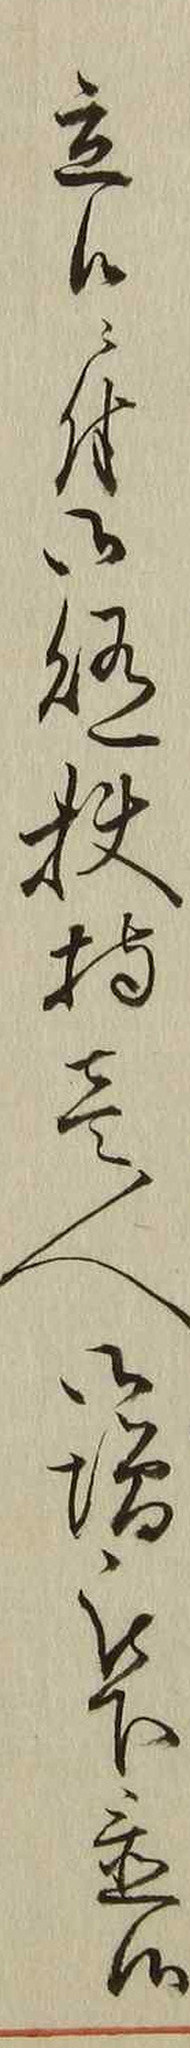立候ニ付御賄扶持壱人御増被下置候
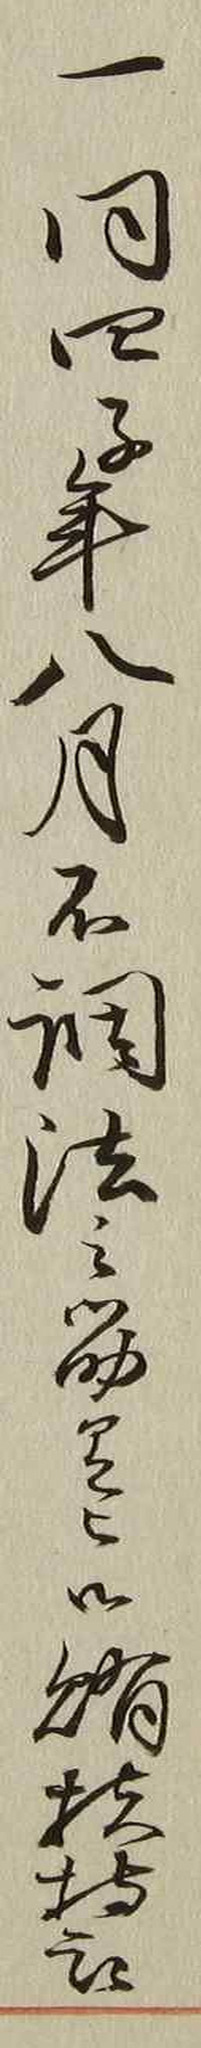一同四子年八月不調法之筋有之御賄扶持被
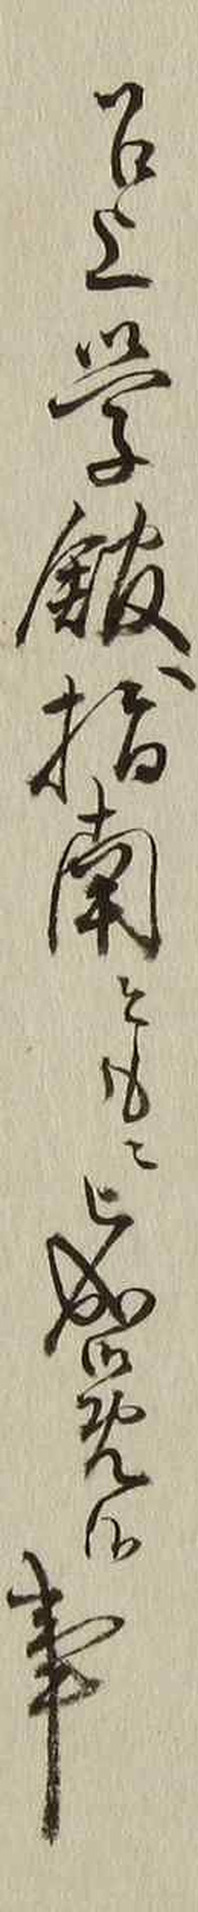召上学館へ指南ともに被成御免候事
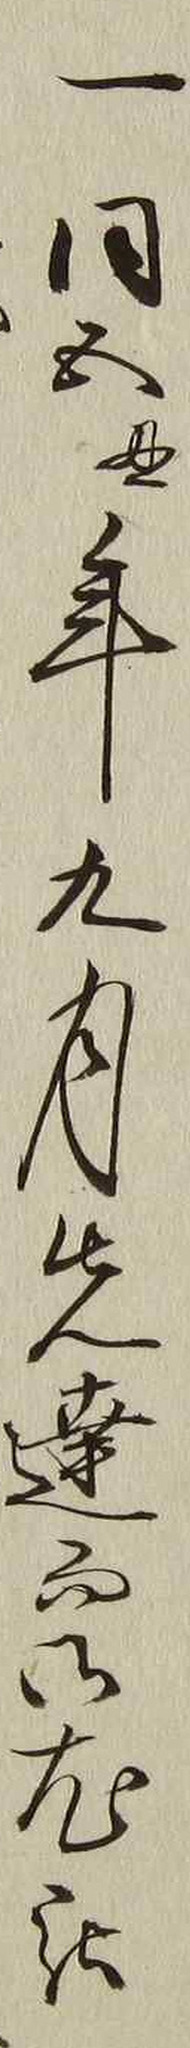一同五丑年九月先達而御尤被
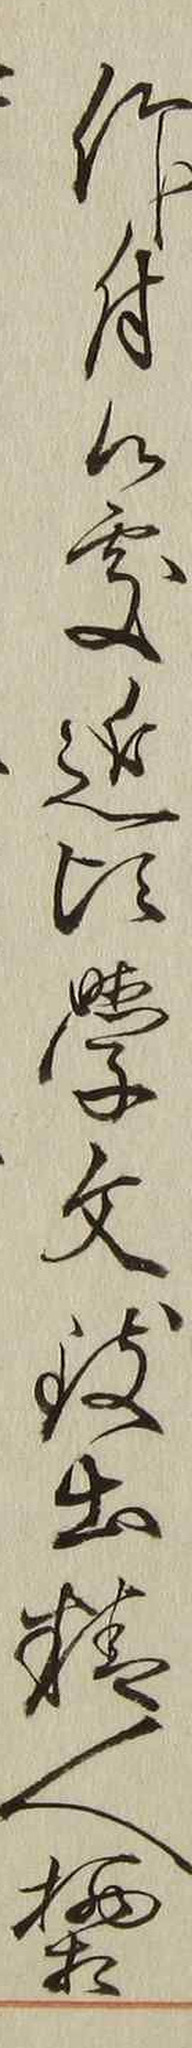仰付候処近頃学文致出精人柄相
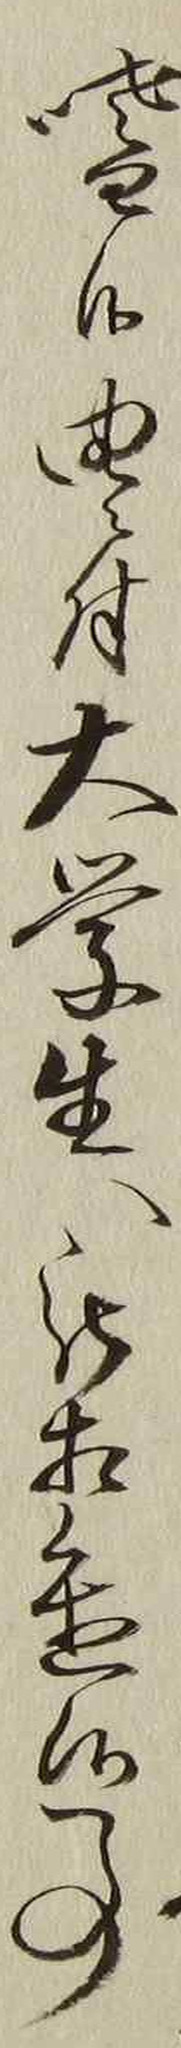嗜候由ニ付大学生へ被相進候事
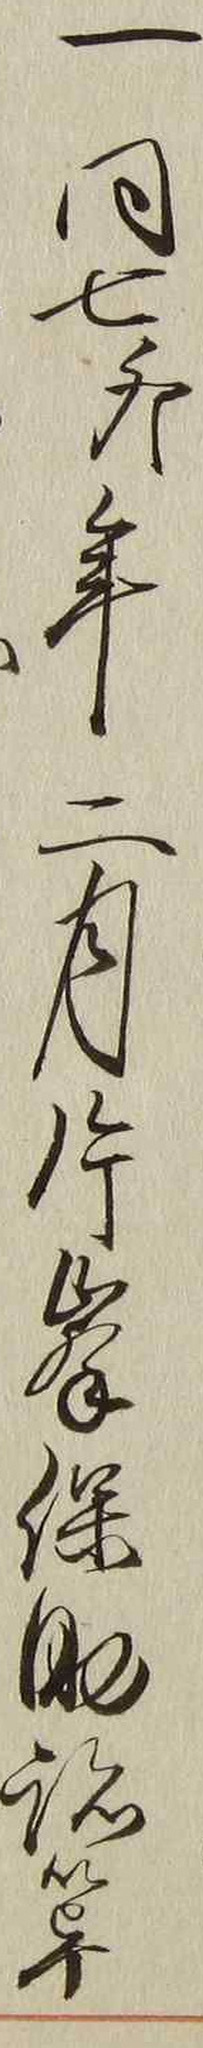一同七卯年二月片峯保助跡篳
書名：諸士系譜　巻之57　ほ之部4
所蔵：会津若松市立会津図書館
